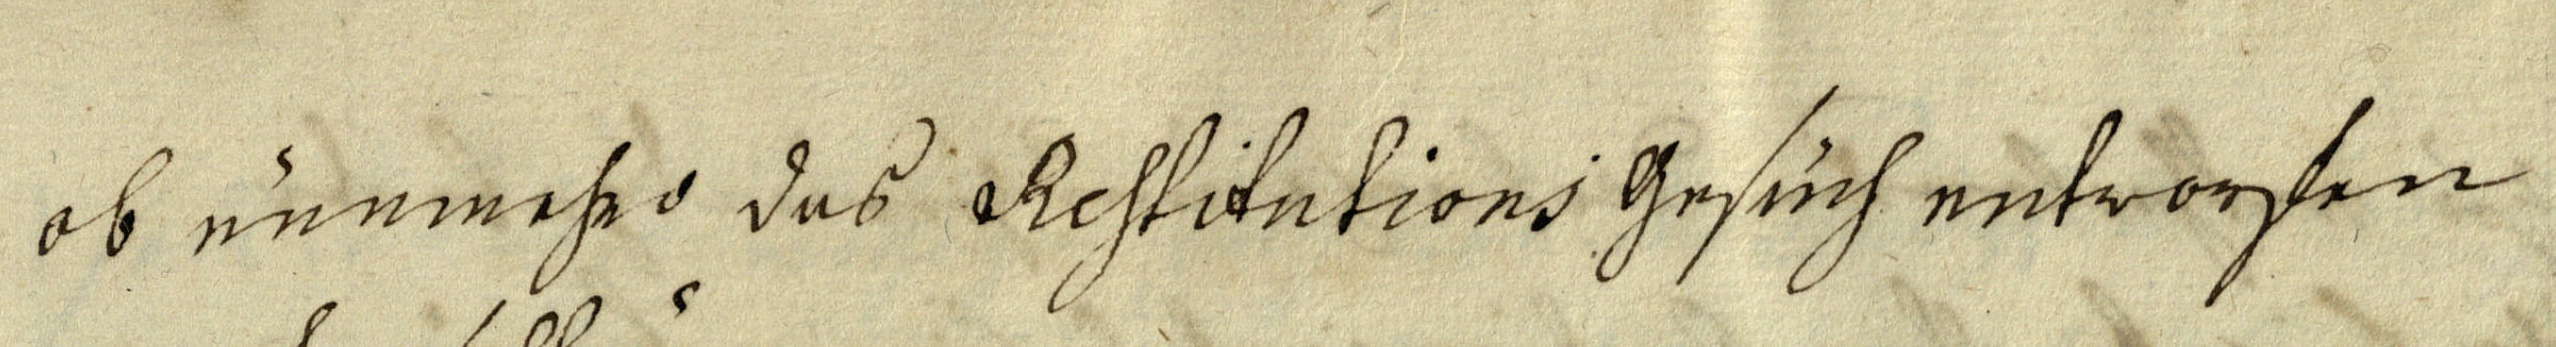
ob nunmehro das Restitutions Gesuch entworfen
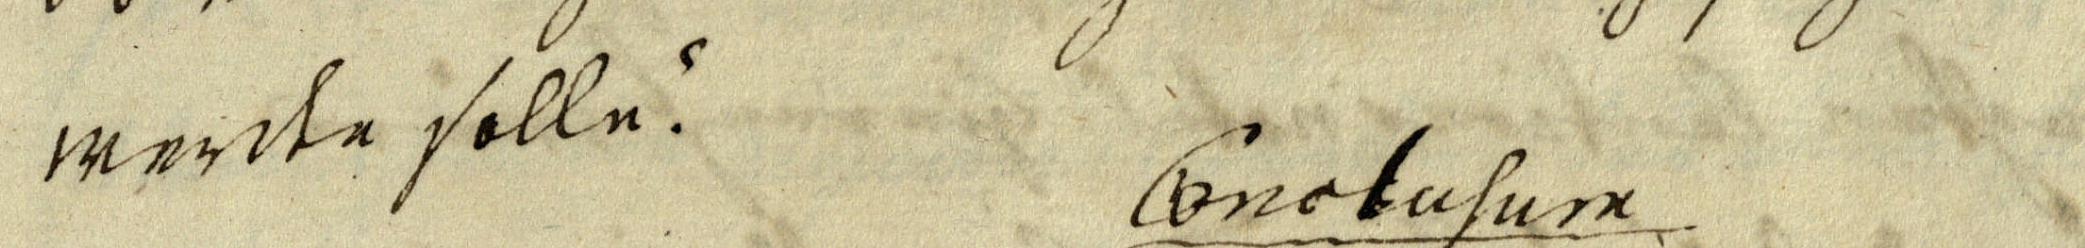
werden solle?
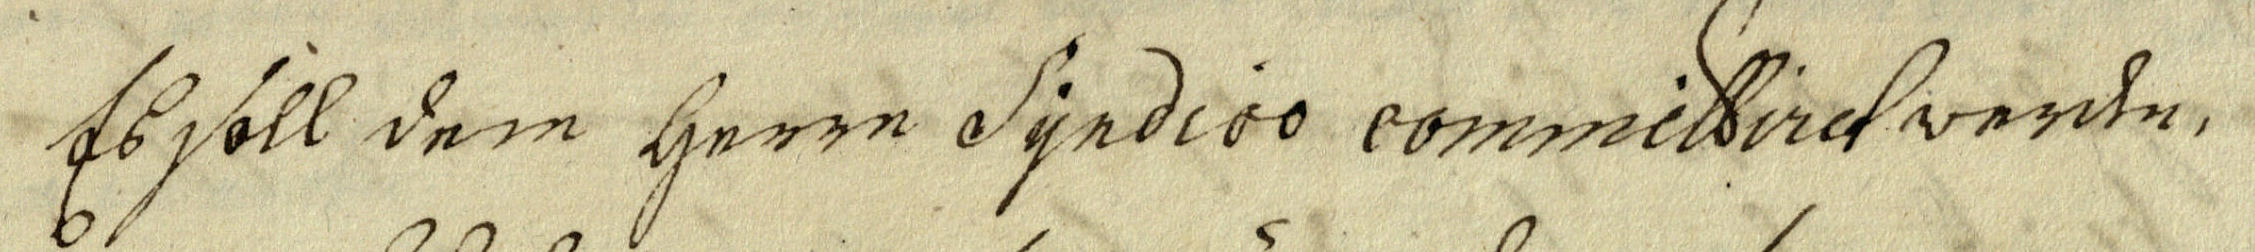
Es soll dem Herrn Sÿndico commitiret werden,
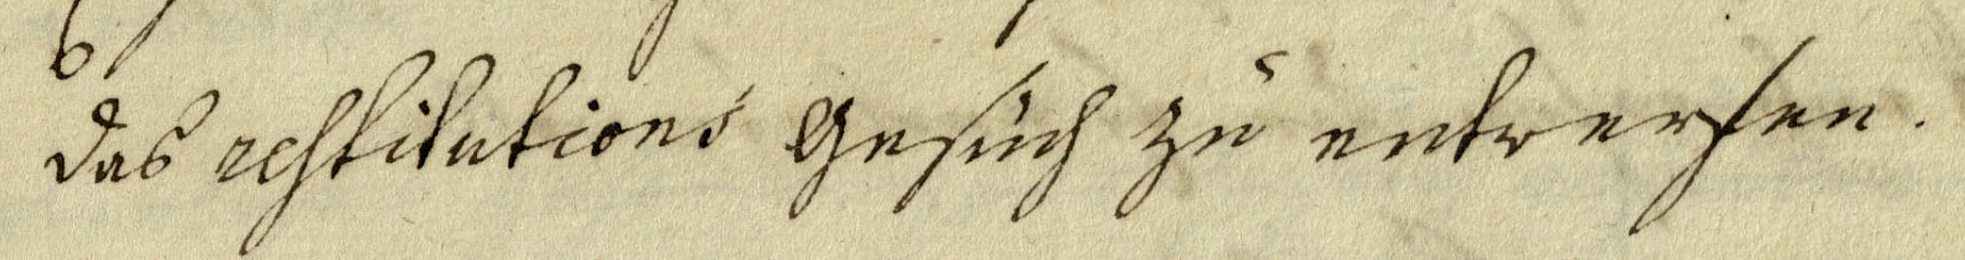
das restitutions Gesuch zu entwerfen.
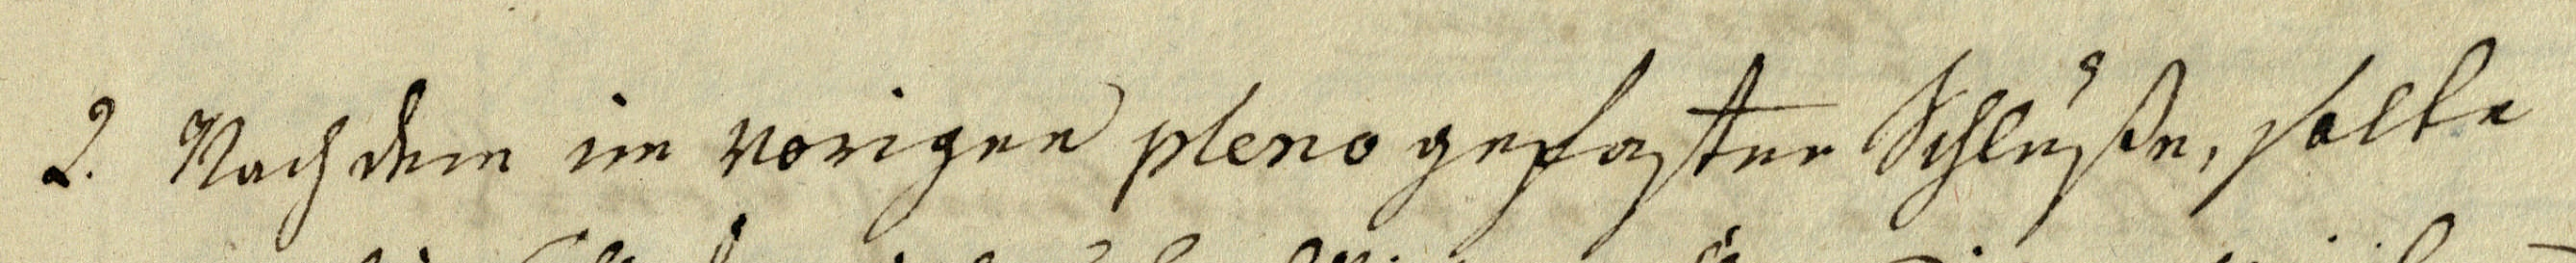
2. Nach dem im vorigen pleno gefsten Schluße, solte
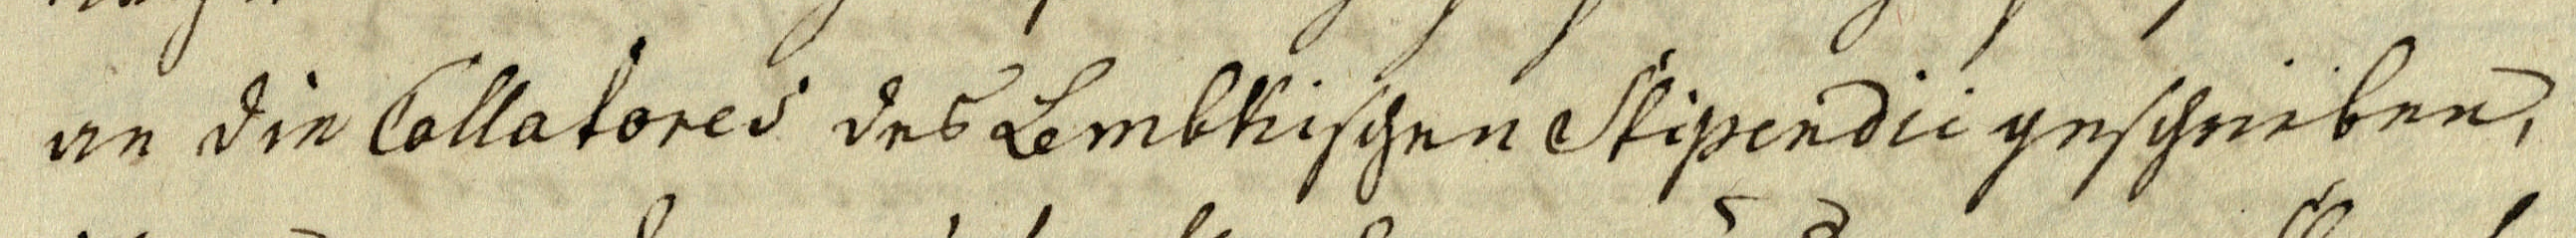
an die Collatores des Lembkischen Stipendii geschrieben,
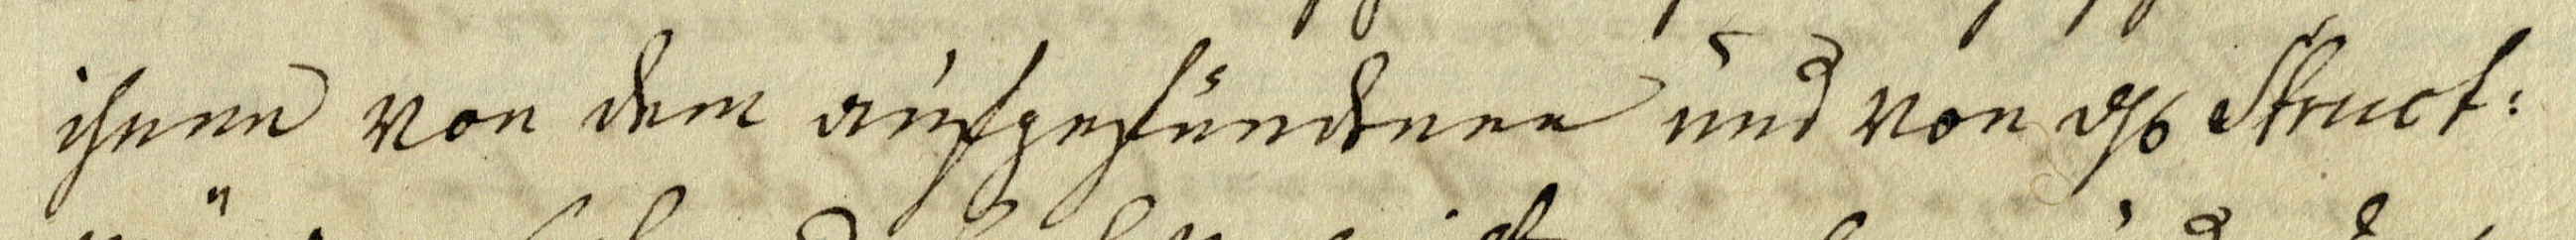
ihnen von dem aufgefundenen und von dh Struct.
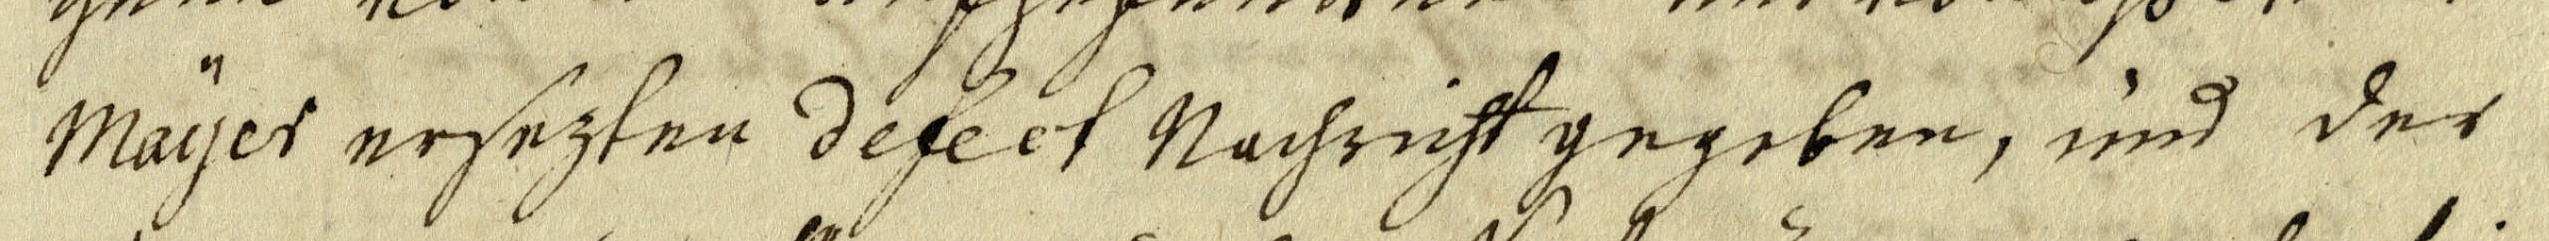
Maÿer ersezten defect Nachricht gegeben, und der
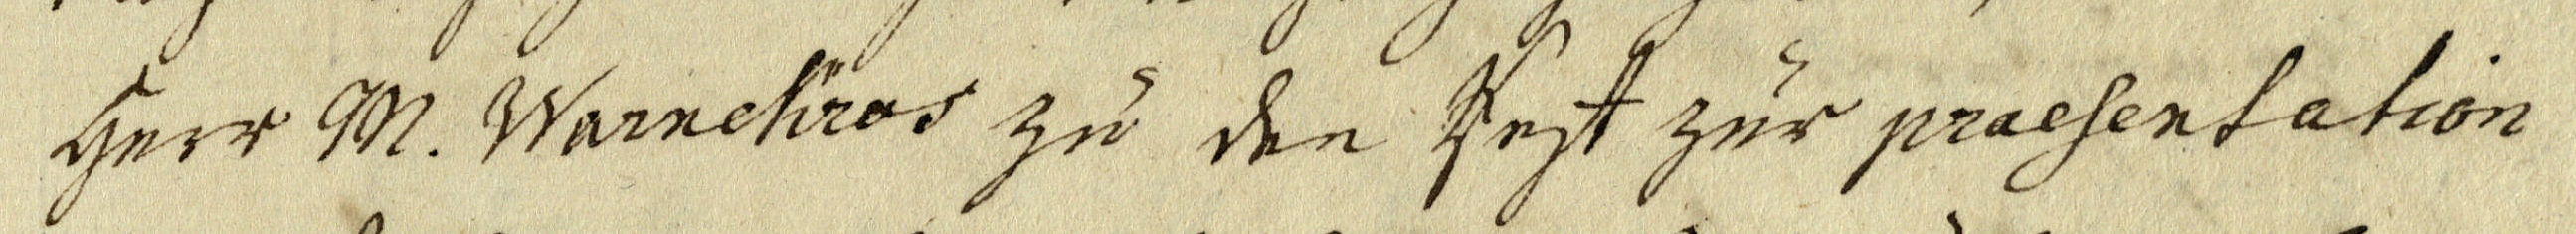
Herr M. Warnekros zu den Rest zur praesentation
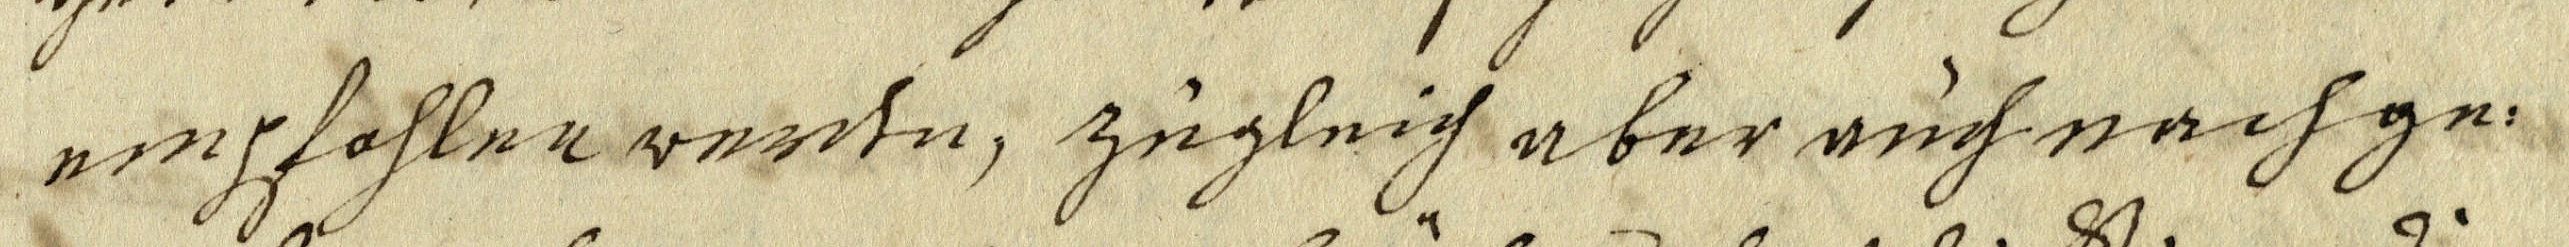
empfohlen werden, zugleich aber auch nachge¬
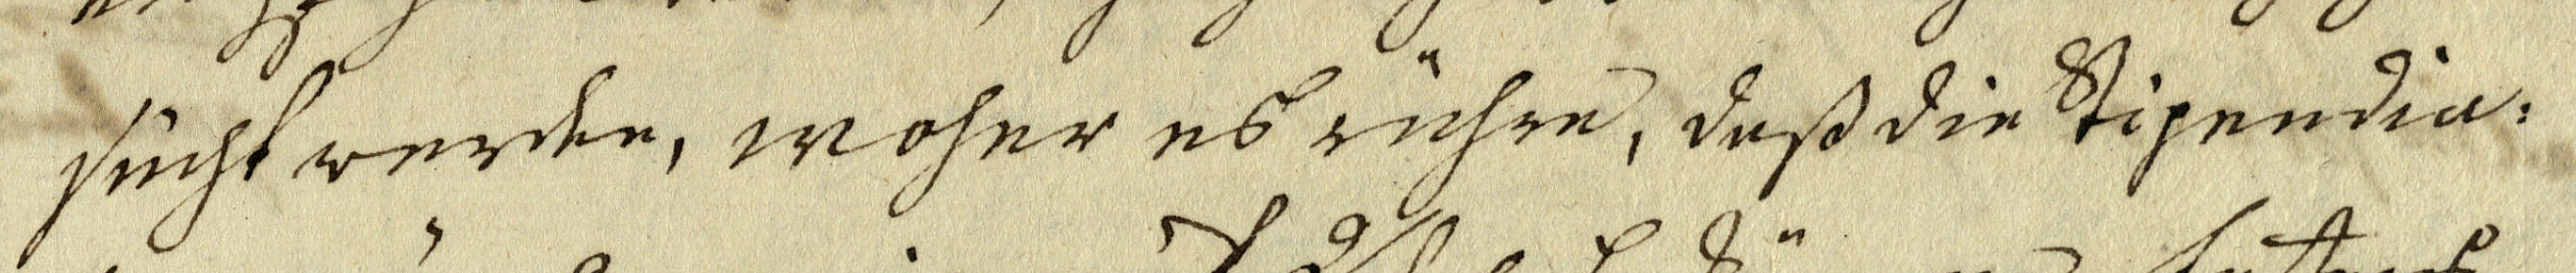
sucht werden, woher es rühre, daß die Stipendia¬
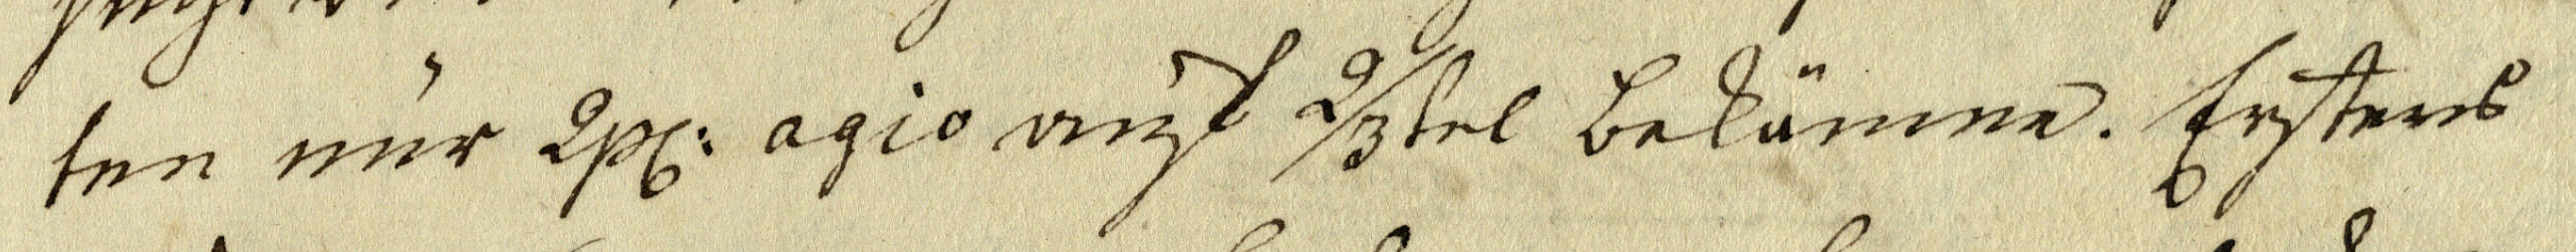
ten nur 2 p. agio auf ²/³ tel bekämen. Erstens
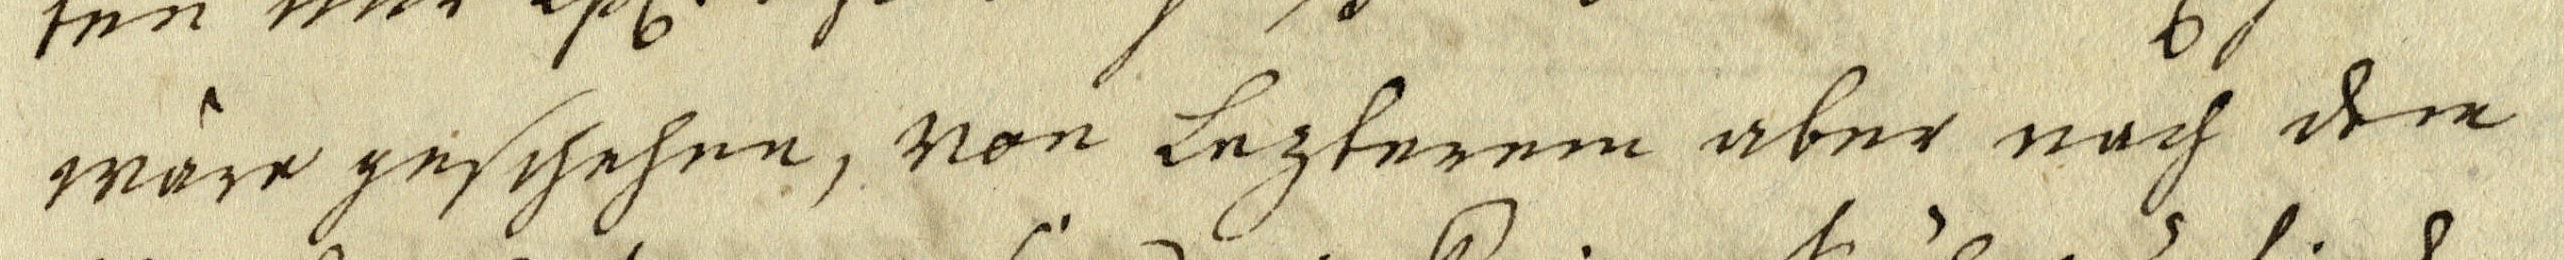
wäre geschehen, von Lezteren aber nach dem
